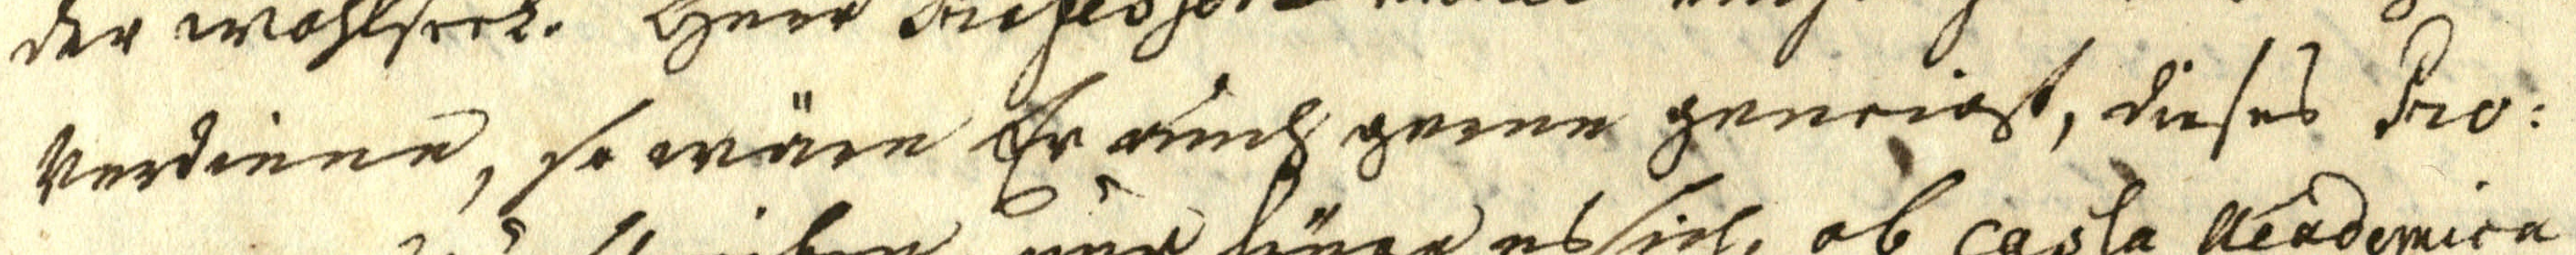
verdiene, so wäre Er auch gerne geneigt, dieses Pro¬
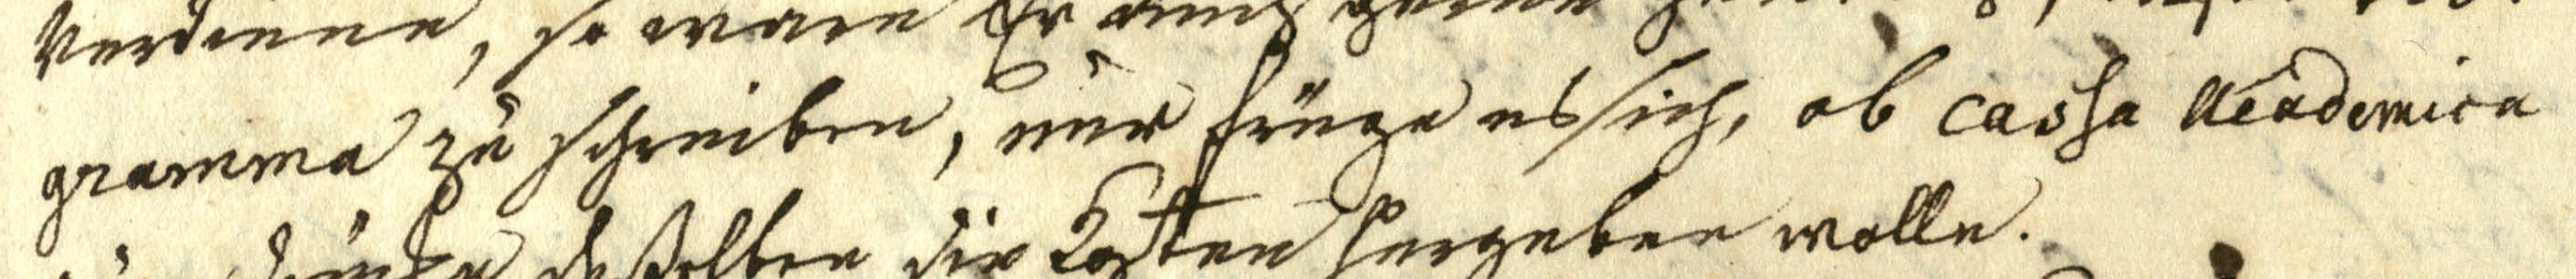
gramma zu schreiben, nur früge es sich, ob casse Academica
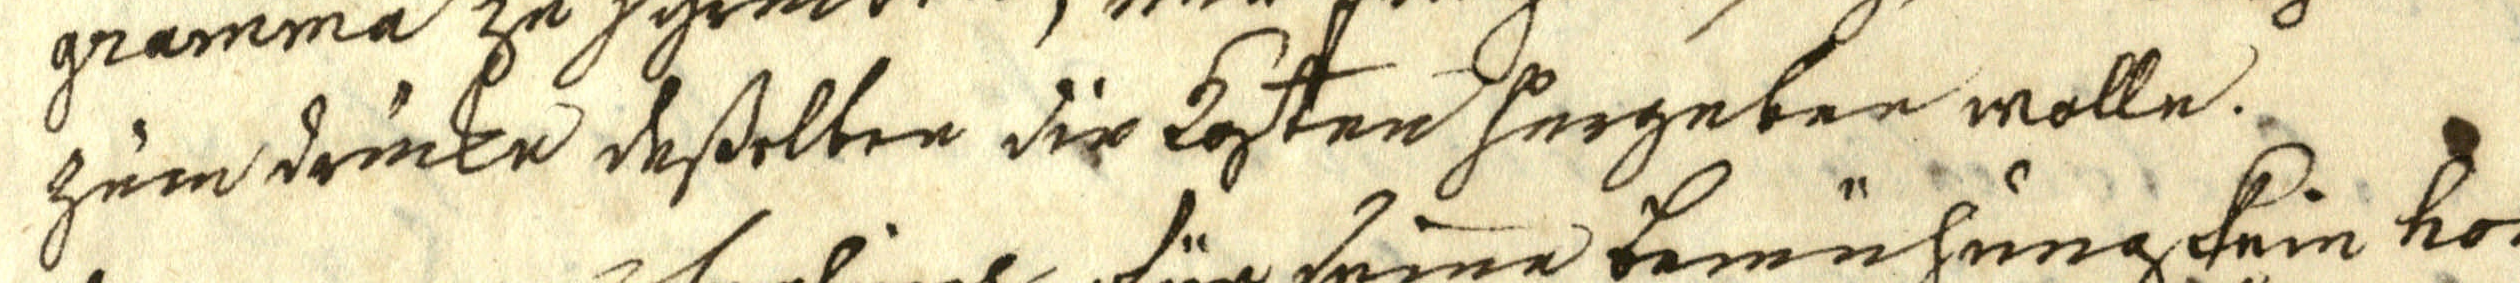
zum Drucke deßelben der Kosten hergeben wolle.
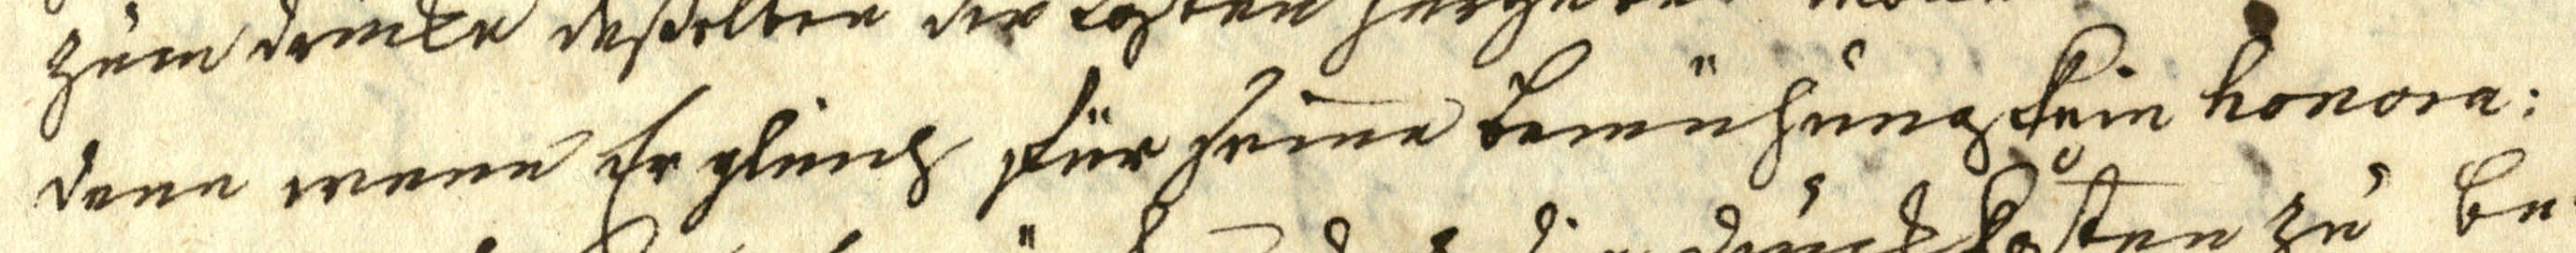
denn wenn Er gleich für seine Bemühung kein honora¬
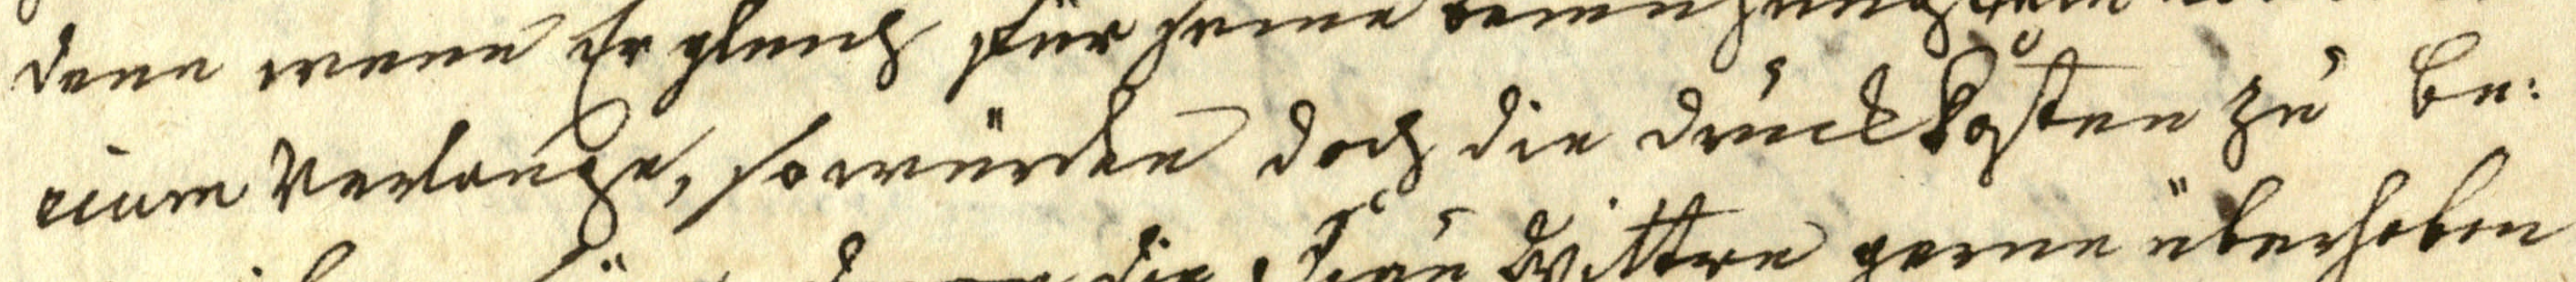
rium verlange, so werden doch die Druckkosten zu be¬
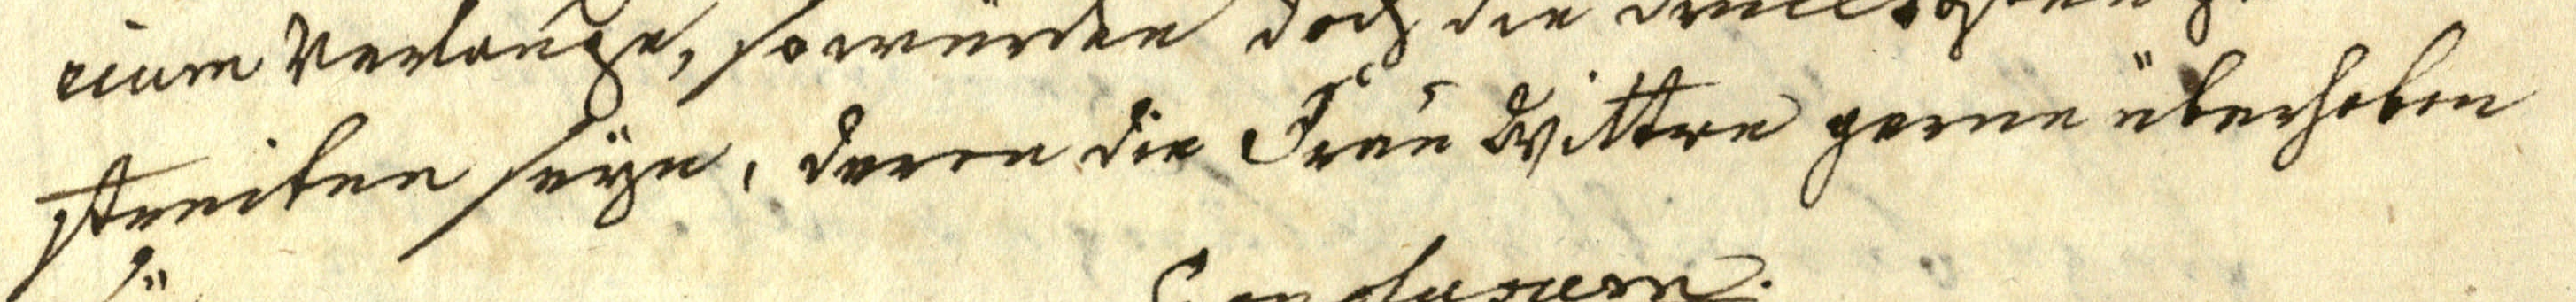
streiten seÿn, deren die Frau Wittwe gerne überhoben
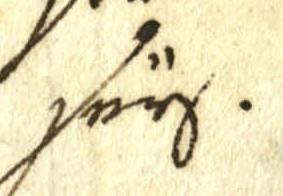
seÿ.
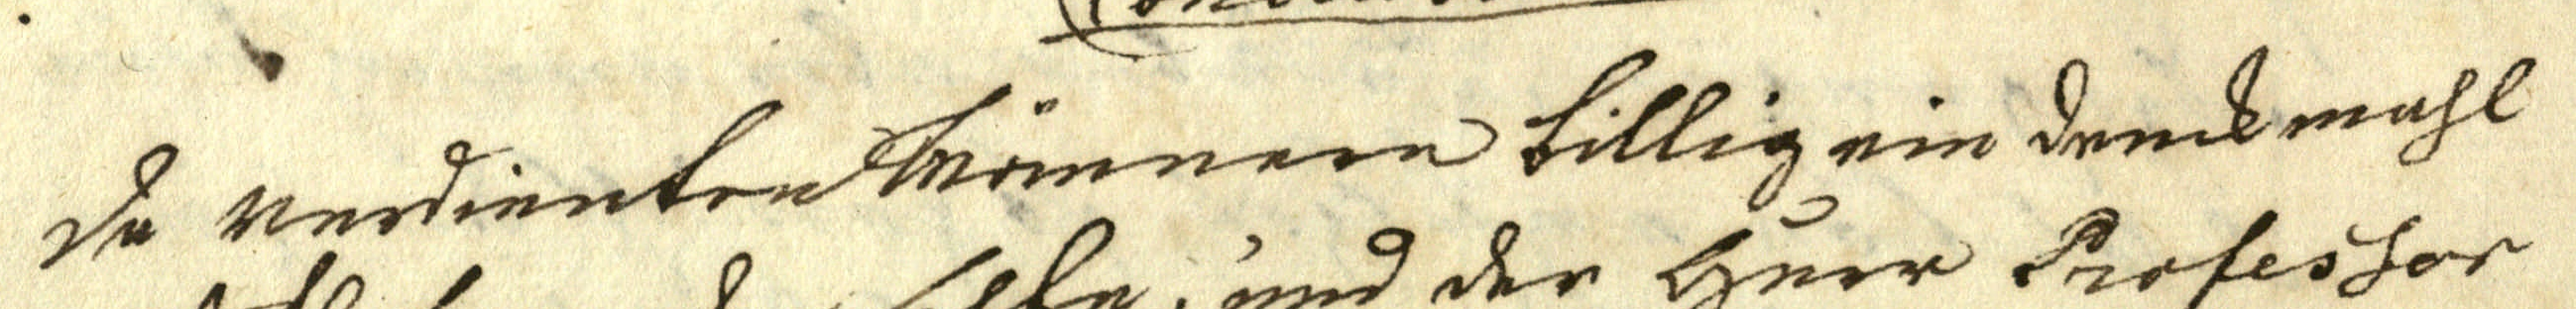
Da verdienten Männern Billig ein Denkmahl
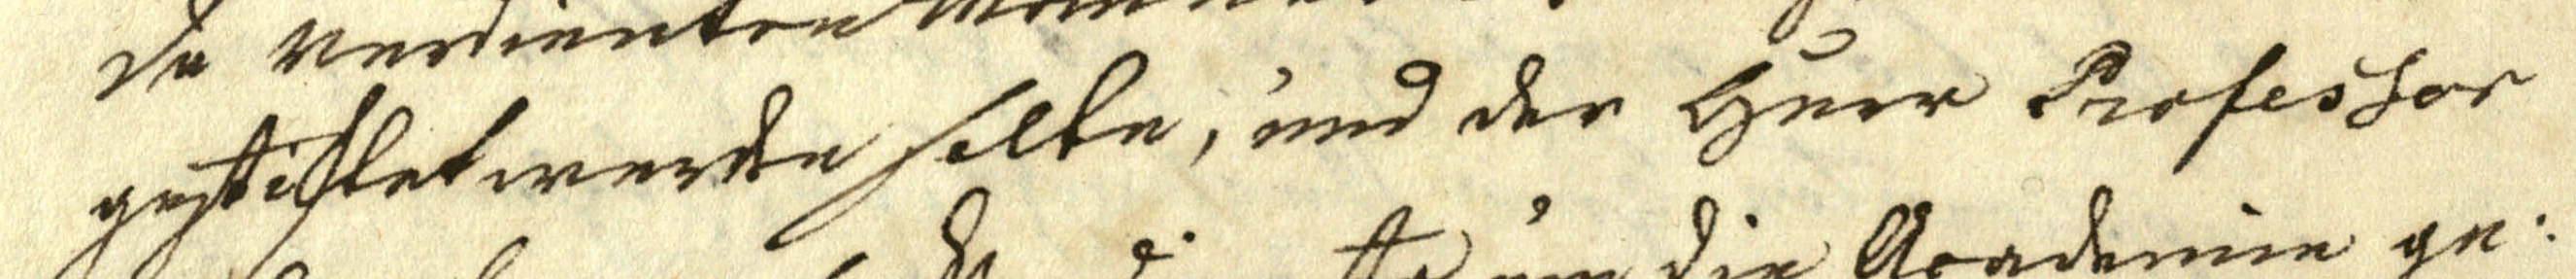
gestiftet werden solte, und der Herr Professor
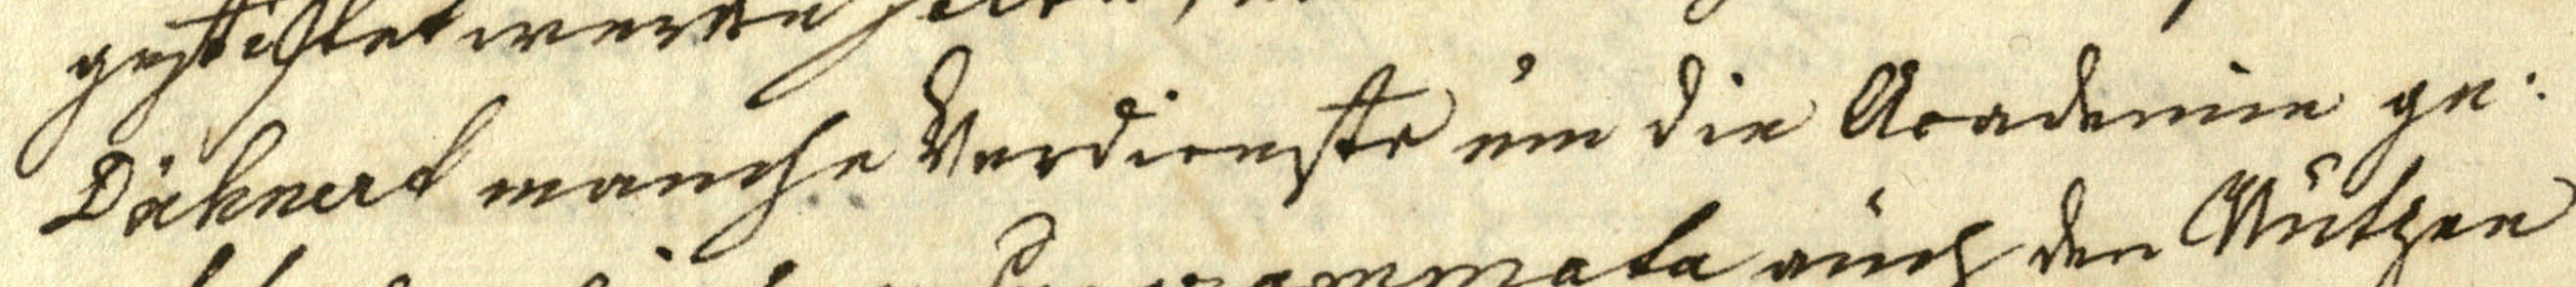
Dähnert manche Verdienste um die Academie ge¬
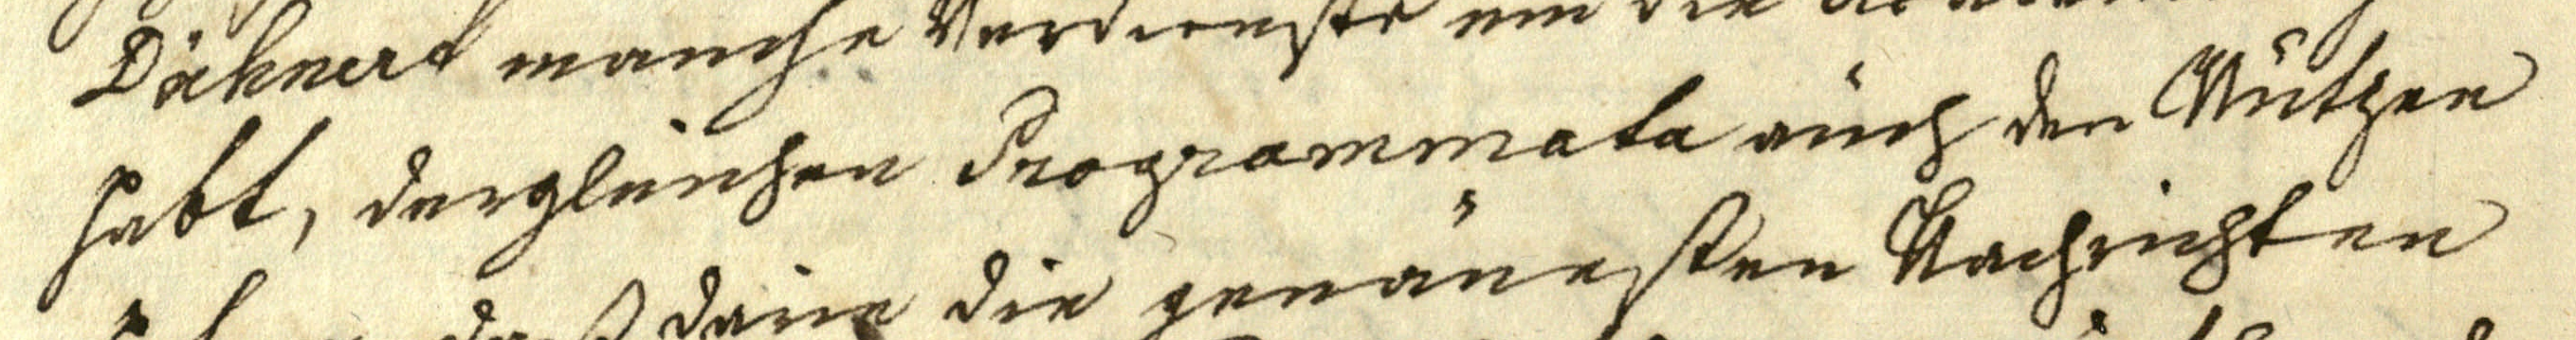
habt, dergleichen Programmata auch den Nutzen
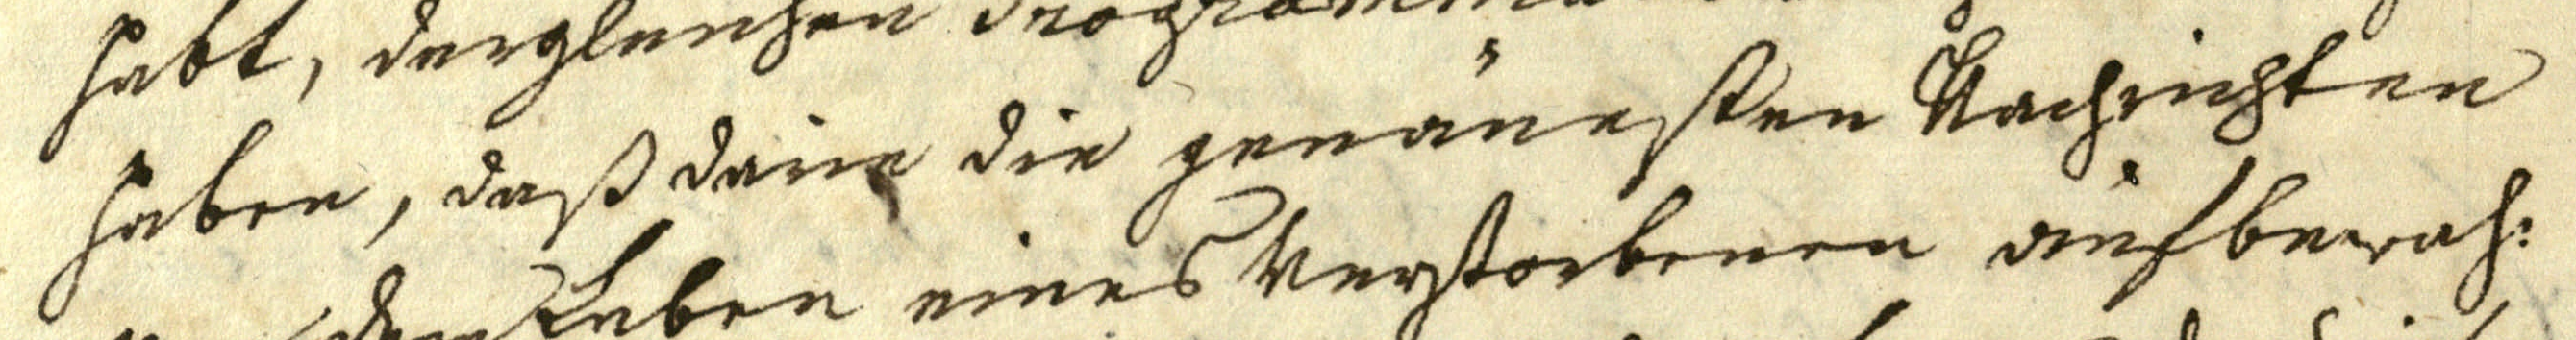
haben, daß darin die genauesten Nachrichten
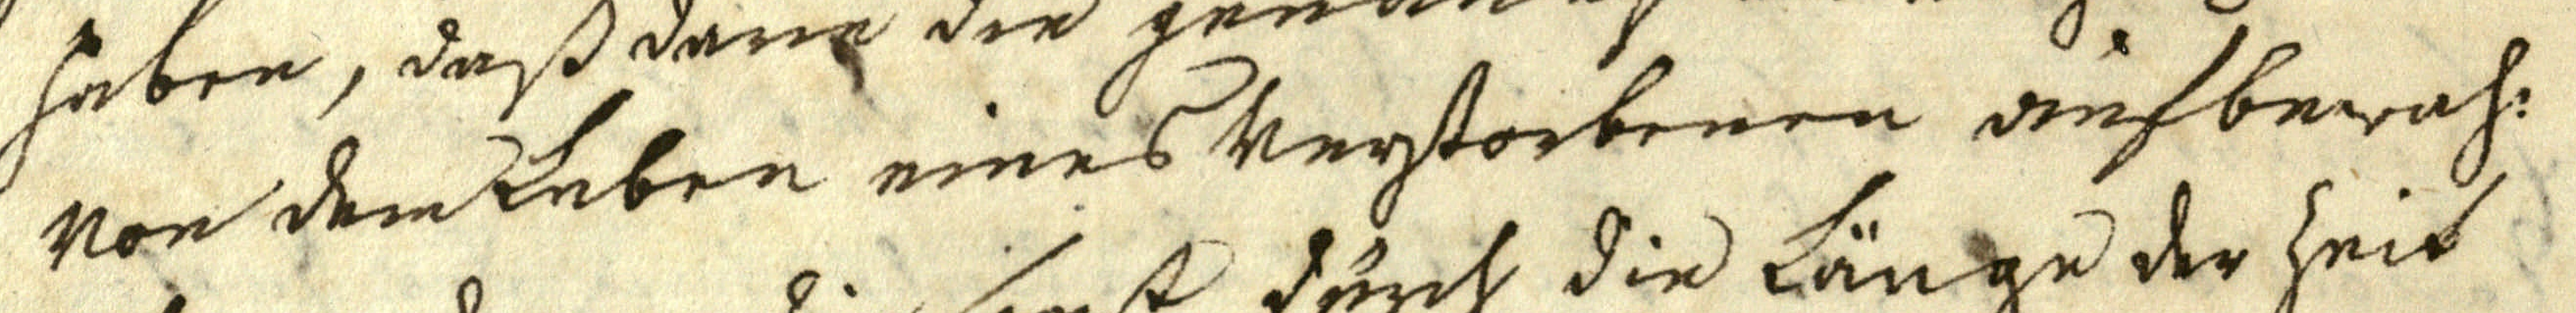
von dem Leben eines Verstorbenen aufbewah¬
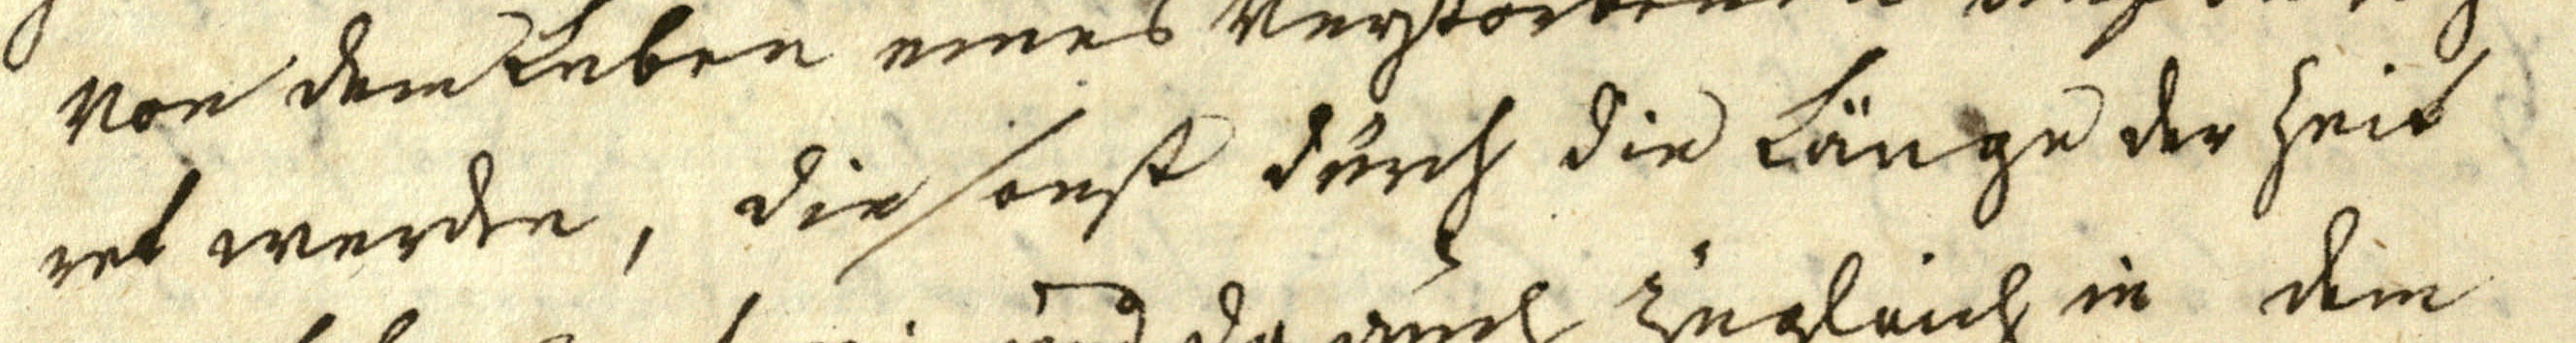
ret werden, die sonst durch die Länge der Zeit
